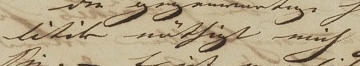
litik nöthigt mich
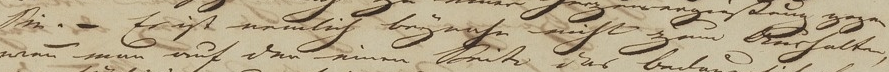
Sie. – Es ist nemlich beynahe nicht zum Aushalten,
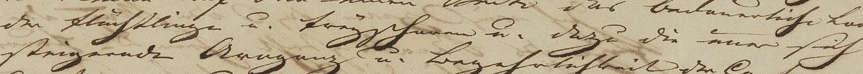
der Flüchtlinge u. Freyschaaren u. dazu die immer sich
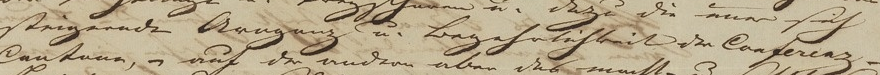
steigernde Aroganz u. Begehrlichkeit der Conferenz -
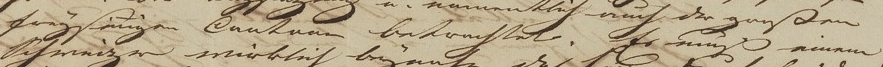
freysinnigen Cantone betrachtet. Es muß einem
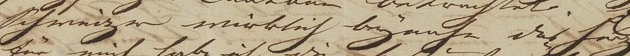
Schweizer wirklich beynahe das Herz
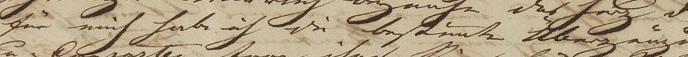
Für mich habe ich die bestimmte Überzeugung:
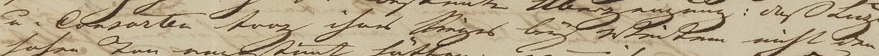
u. Consorten troz ihres Sieges bey Weitem nicht den
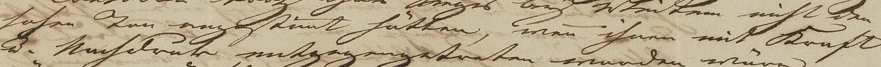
hohen Ton angestimmt hätten, wenn ihnen mit Kraft
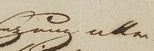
Tagsazung aller-
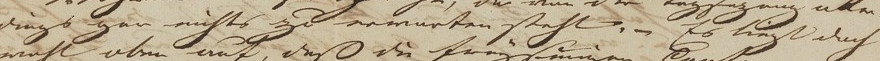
dings gar nichts zu erwarten steht. – Es liegt doch
